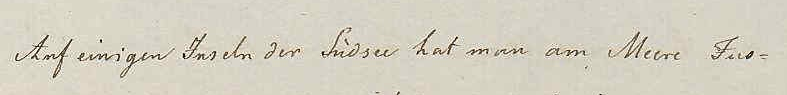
Auf einigen Inseln der Südsee hat man am Meere Fus-
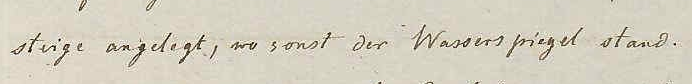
steige angelegt, wo sonst der Wasserspiegel stand.
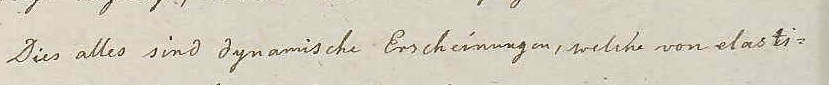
Dies alles sind dynamische Erscheinungen, welche von elasti-
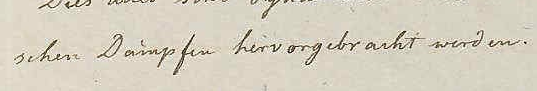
schen Dämpfen hervorgebracht werden.
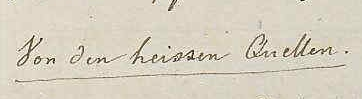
Von den heissen Quellen.
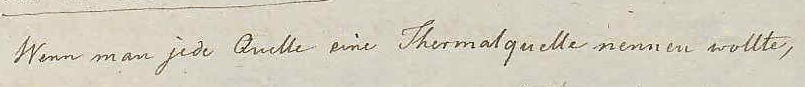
Wenn man jede Quelle eine Thermalquelle nennen wollte,
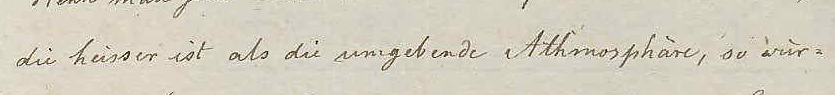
die heisser ist als die umgebende Athmosphäre, so wür-
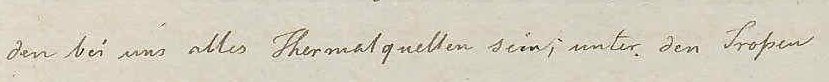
den bei uns alles Thermalquellen sein, unter den Tropen
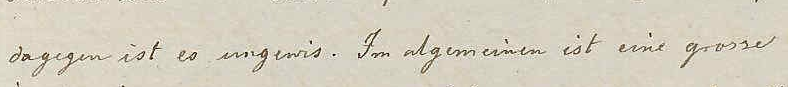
dagegen ist es ungewis. Im algemeinen ist eine grosse
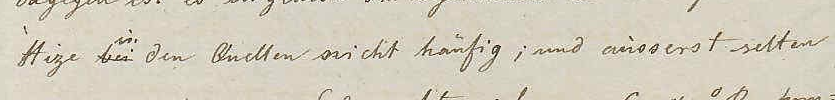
Hize beiin den Quellen nicht häufig; und äusserst selten
